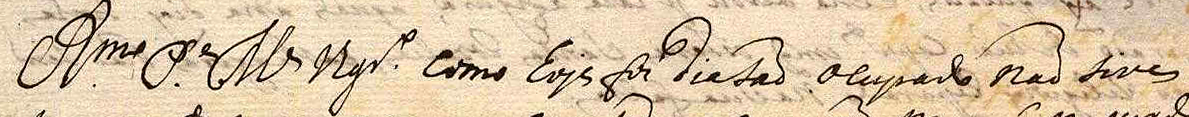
Rmo P.e Me Vigr.o como hoje foi dia taõ ocupado naõ tive
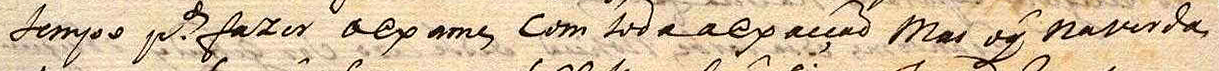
tempo p.a fazer o exame com toda a exacçaõ mas o q̄ na verda
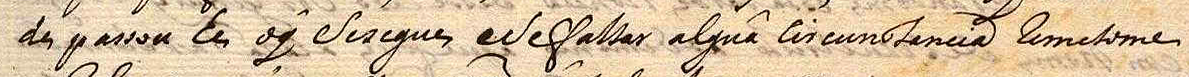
de passou he o q̄ se segue, e se faltar alguā circunstancia Remetome
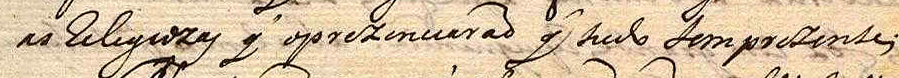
as Religiozas q̄ o prezenciaraõ q̄ tudo tem prezente;
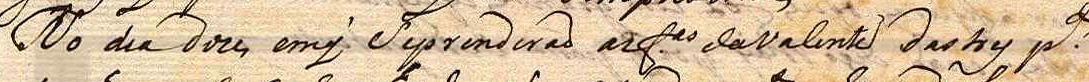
No dia doze em q̄ se prenderão as f.as da valente das tres p.a
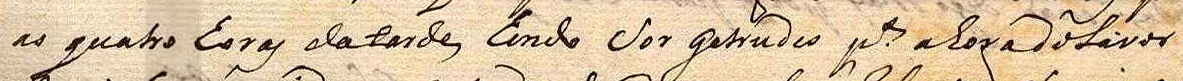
as quatro horas da tarde, hindo sor getrudes p.a a hora do Lavor
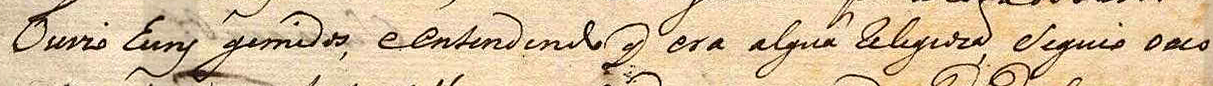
Ouvio huns gemidos, e entendendo q̄ era alguā Religioza, seguio o eco
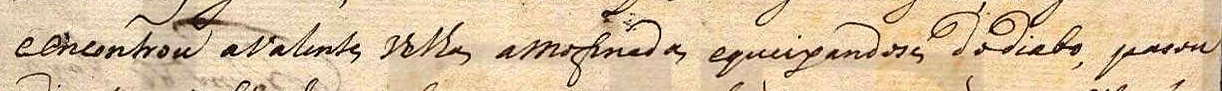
e encontrou a Valente, Velha amofinada e queixandose do diabo, pasou
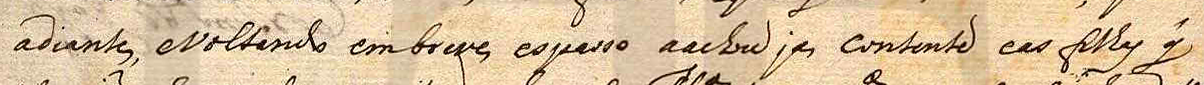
adiante, e voltando em breve espasso a achou ja contente e as filhas q̄
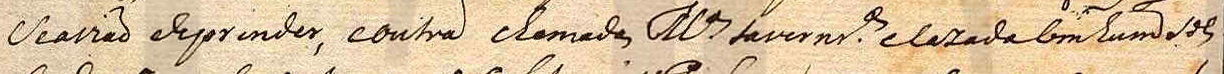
Se aviaõ de prender, e outra chamada Ma tavernr.a e cazada com hum sol
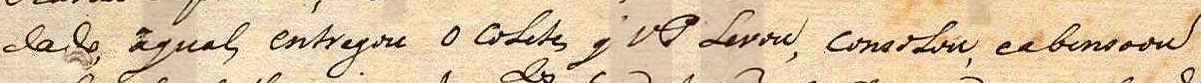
dado, á qual entregou o coLete q̄ VP Levou, consoLou, e abensoou
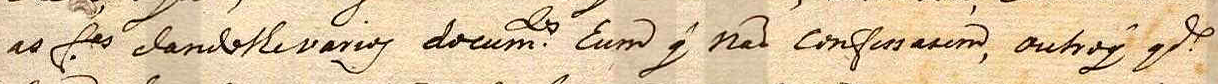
as f.as dandolhe varios docum.tos hum q̄ não confessasem, outros q̄ qd.o
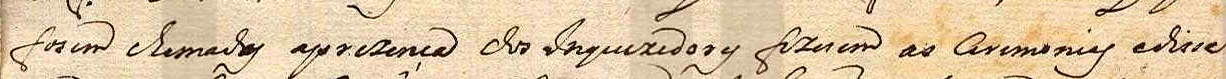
fosem chamadas a prezença dos Inquizidores fizesem as Ceremonias e disse
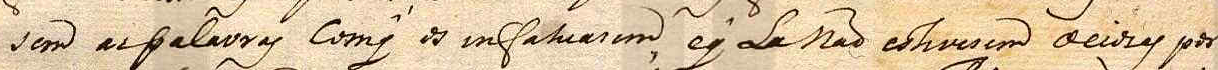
sem as palavras com q̄ os infatuasem, e q̄ La não estevesem ociozas por
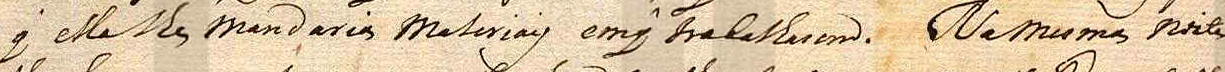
q̄ ella lhe mandaria materiais em q̄ trabalhasem. Na mesma noite
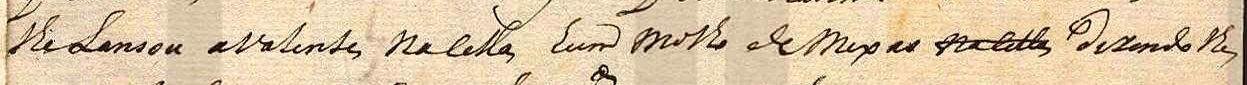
lhe Lansou a valente na cella, hum molho de Mexas nacella, dizendo lhe
